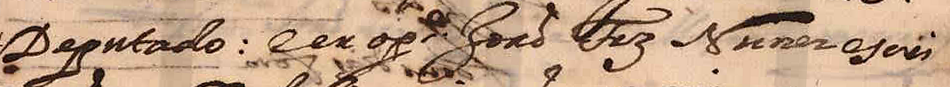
Deputado: e eu o p.e Joaõ Fez Nunez escri
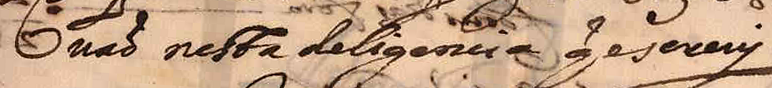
uaõ nesta deligencia q̄ escreuj.
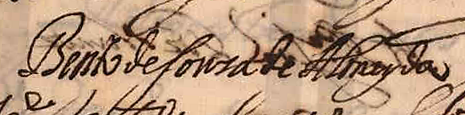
Bento de Souza de Almeyda
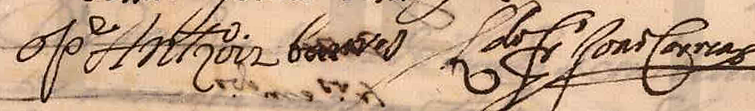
o pe Anto Roiz barros Ldo fr. Joaõ Correa
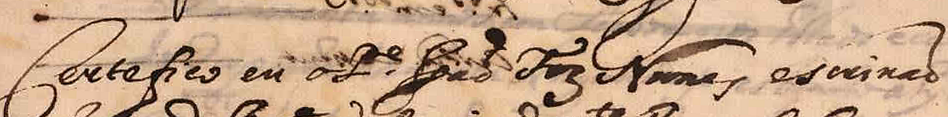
Certefico eu o P.e Joaõ Frz Nunes escriuaõ
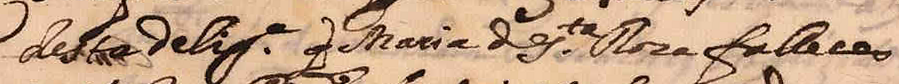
desta delig.a q̄ Maria de s.ta Roza falleceo
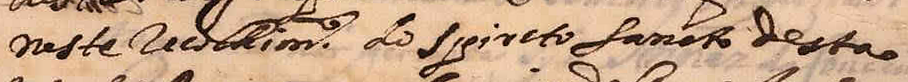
neste Recolhim.to do spirito sancto desta
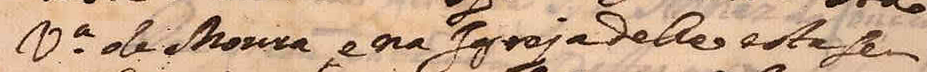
V.a de Moura, e na Jgreja delle esta se
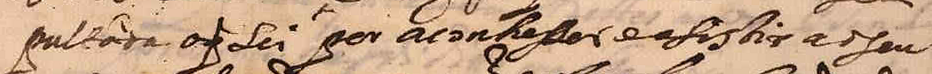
pultada o q̄ sei por a conhesser e asistir ao seu
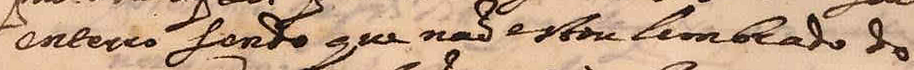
enterro sendo que naõ estou lembrado do
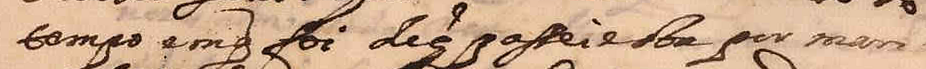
tempo em q̄ foi de q̄ passei esta por man
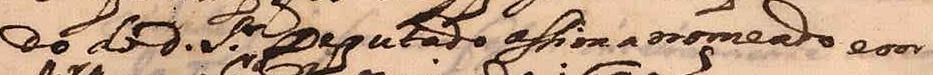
do do d. S.r Deputado assima nomeado em
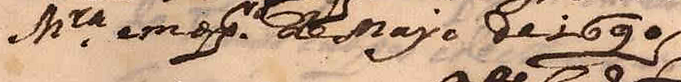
M.ra em o p.ro de Mayo de i690
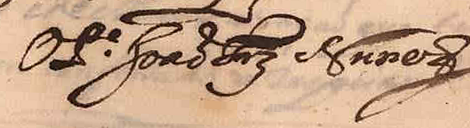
O P.e Joaõ Frz Nunez
